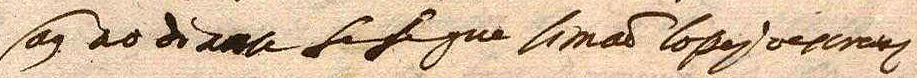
a q̄ ao diante se segue simaõ lopez o escreuj
